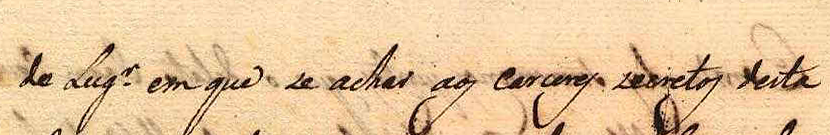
do Lug.r em que se achar aos carceres secretos desta
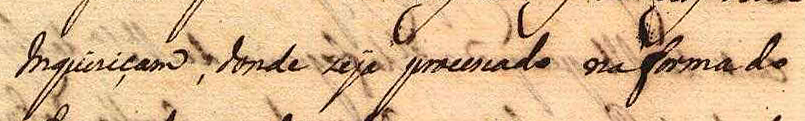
Inquiziçam, donde seja processado na forma do
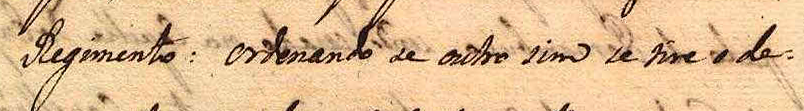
Regimento: Ordenando se outrosim se tire o de
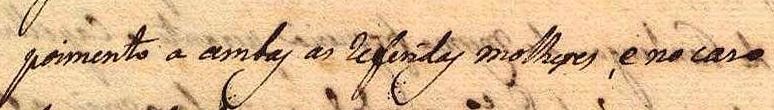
poimento a ambas as Referidas molheres, e no cazo
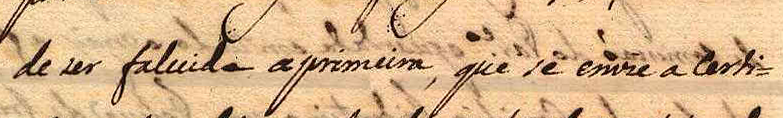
de ser falecida a primeira, que se envie a certi
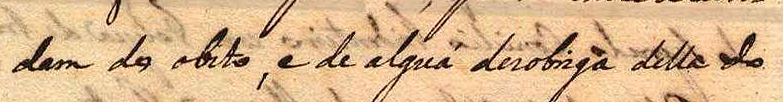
dam do obito, e de alguā dezobriga della do
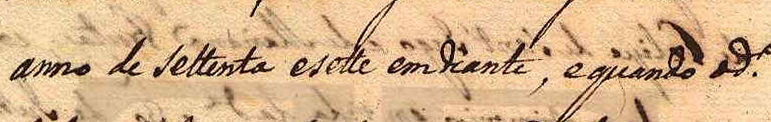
anno de settenta e sette em diante, e quando o d.o
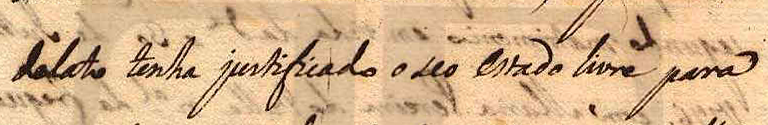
delato tenha justificado o seo estado livre para
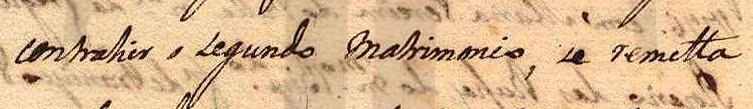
contrahir o segundo Matrimonio, se remetta
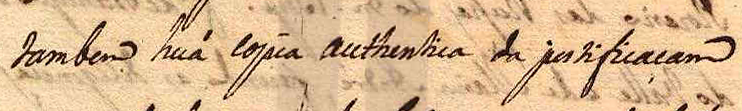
tambem huā copia auttentica da justificaçam.
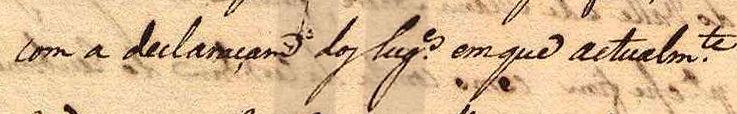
com a declaraçam dos lug.es em que actualm.te
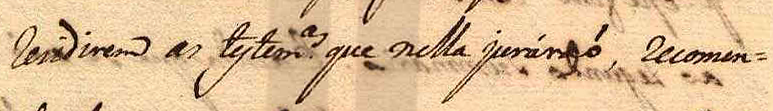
Residirem as testem.as que nella juráraõ, Recomen
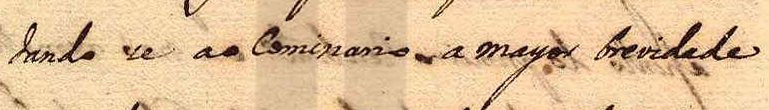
dando se ao Comissario a mayor brevidade.
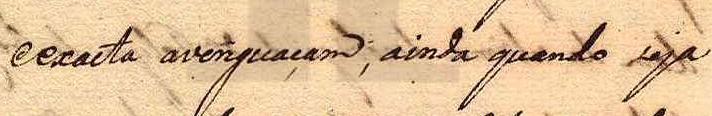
e exacta averiguaçam, ainda quando seja
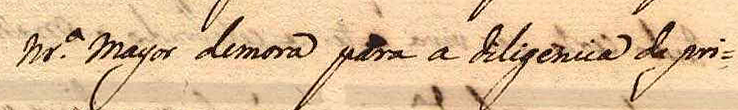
nr.a mayor demora para a diligencia da pri
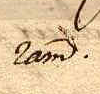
zam
